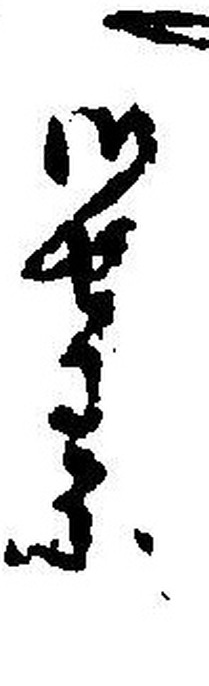御せわに
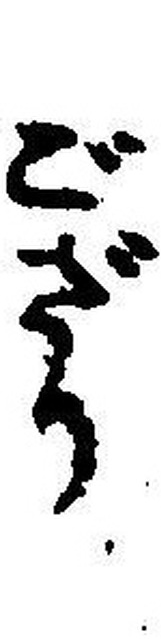ござり
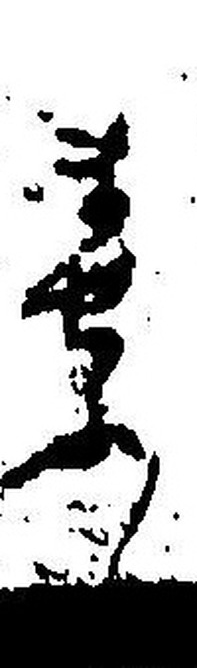ませふ

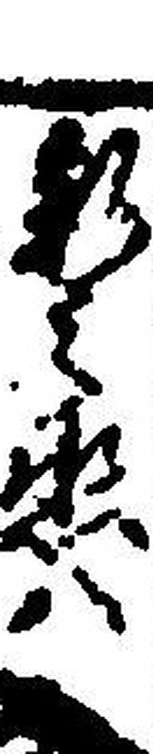新之丞は
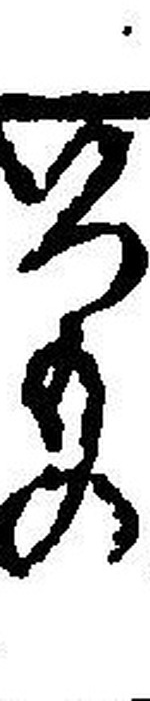いつもの
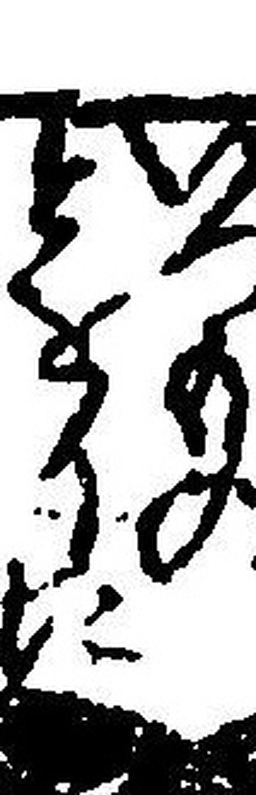とをりに
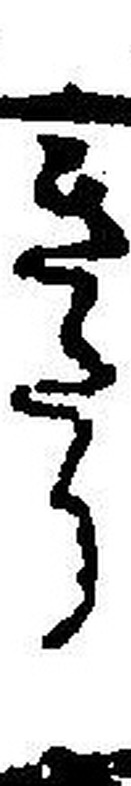きたり
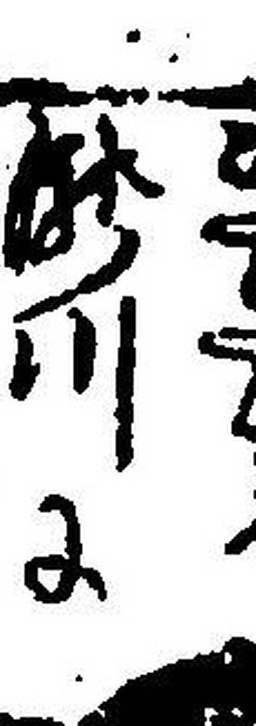滝川に
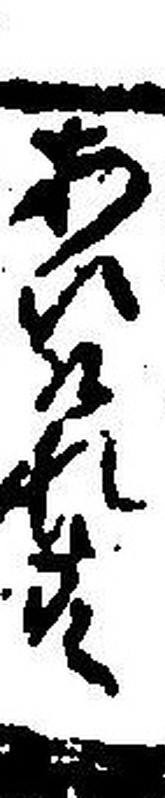あいけれは
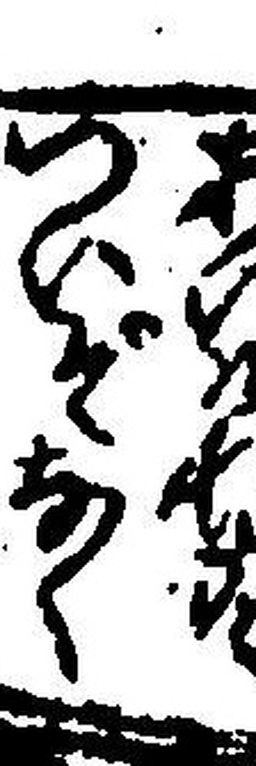ついぞなく
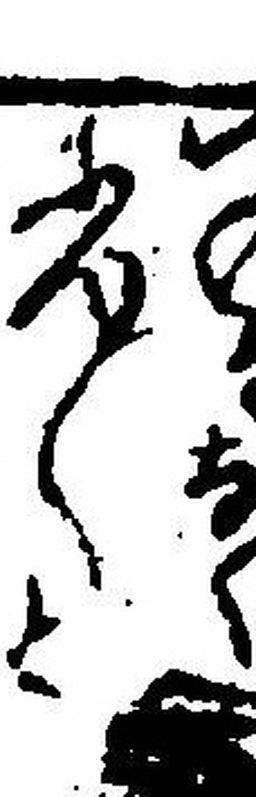ふん〳〵と
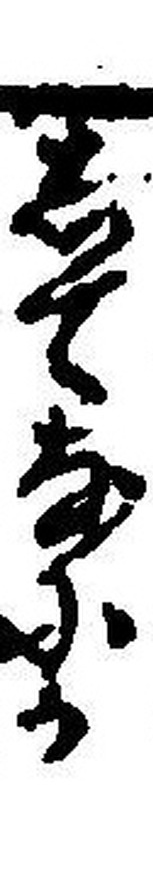してなにか
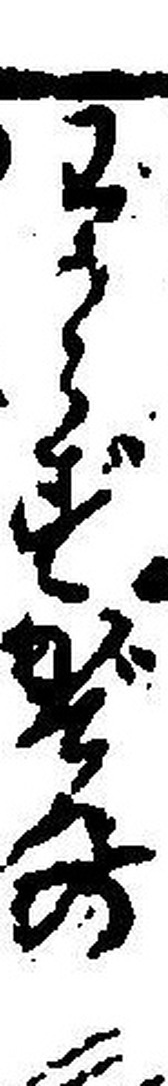わからずがてんの
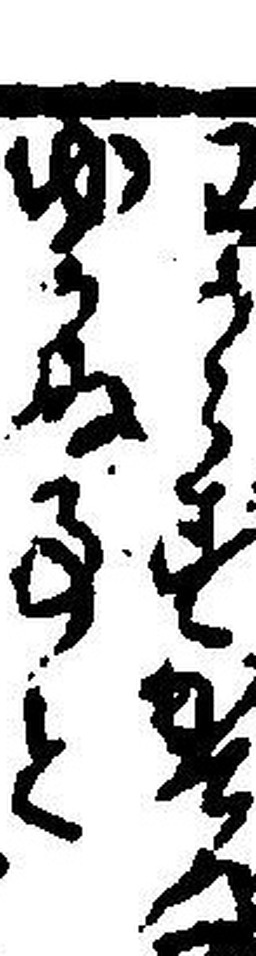ゆかぬ事と
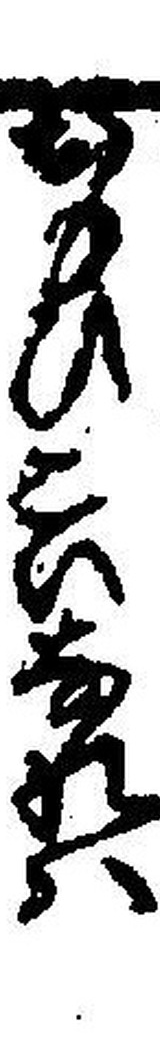おもひこいなれは
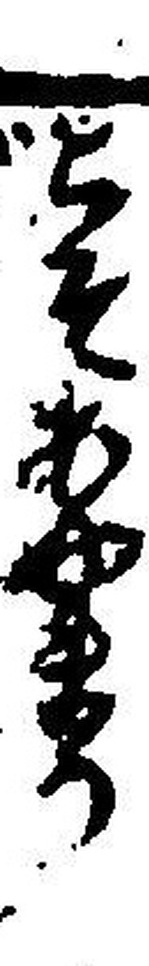こそあやまり
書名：御代参牛時詣 / 市場通笑作
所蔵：東京大学総合図書館 General Library in the University of Tokyo, JAPAN
